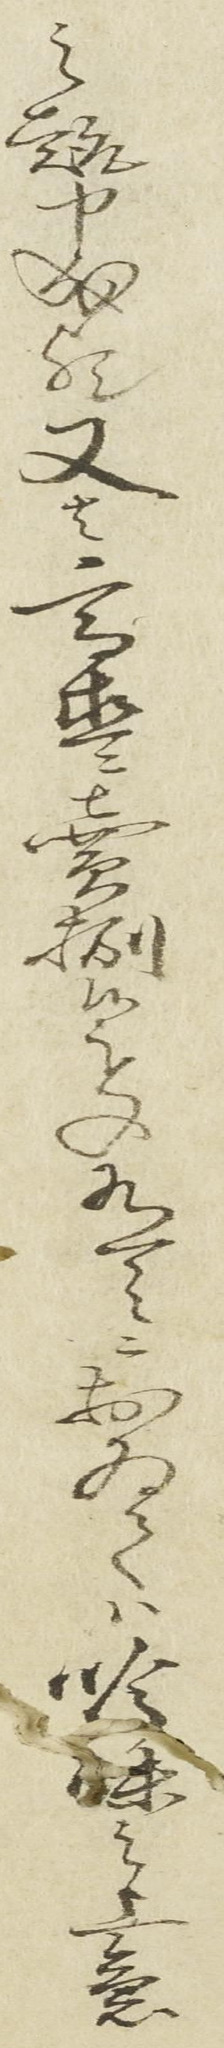之趣申成歟又は高直二売捌候もの有之二おいてハ吟味之上急
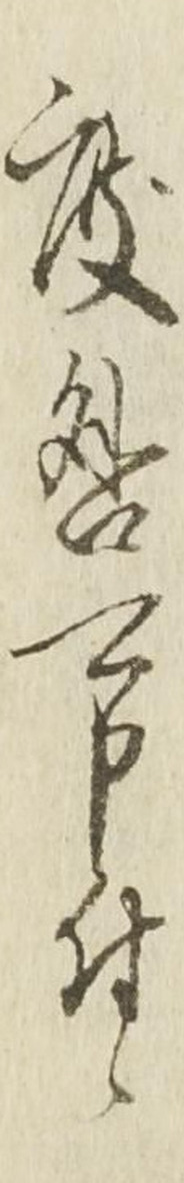度咎可申付候
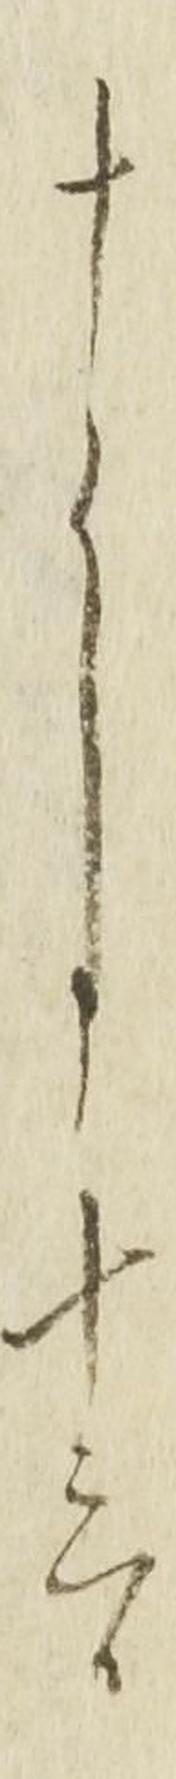十月十三日
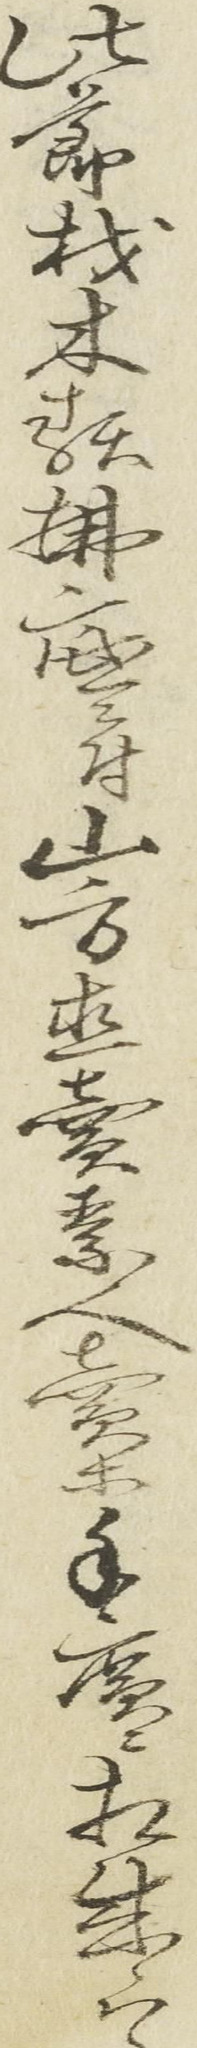此節材木類払底二付山方直売素人売等手広二相成候ハゝ
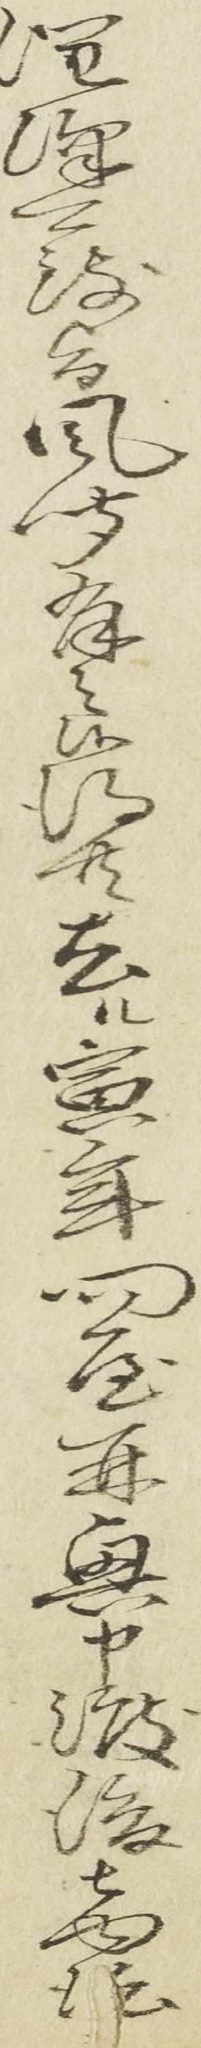潤沢可致旨風聞有之候得共去ル寅年問屋再興申渡後商法も
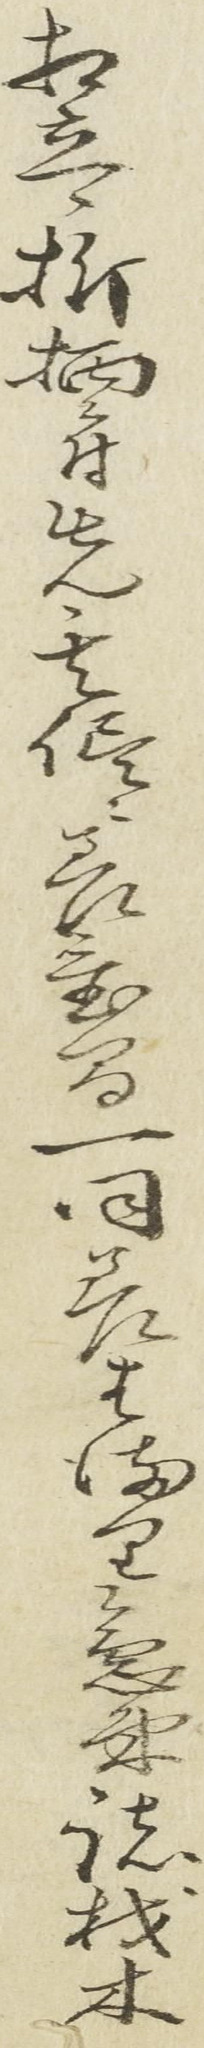相立候折柄ニ付先其侭二差置間一同差はまり二急束諸材木
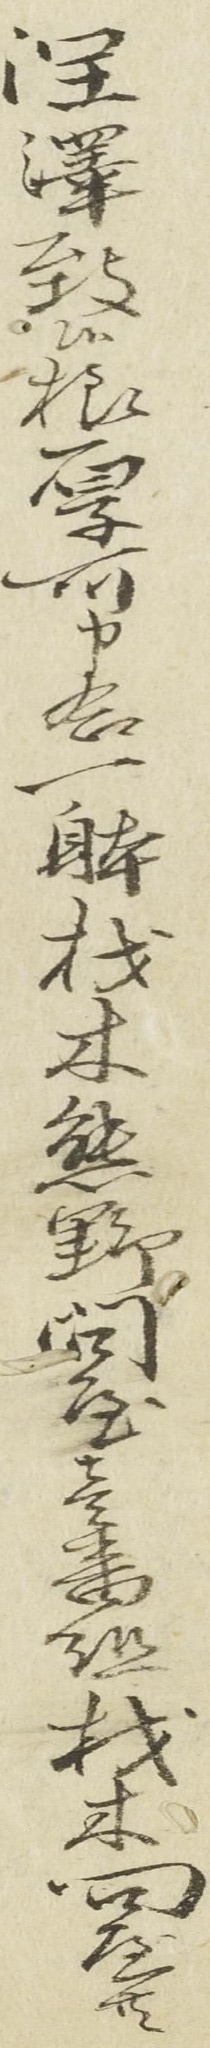潤沢致候様厚可申合一躰材木熊野問屋壱番組材木問屋共
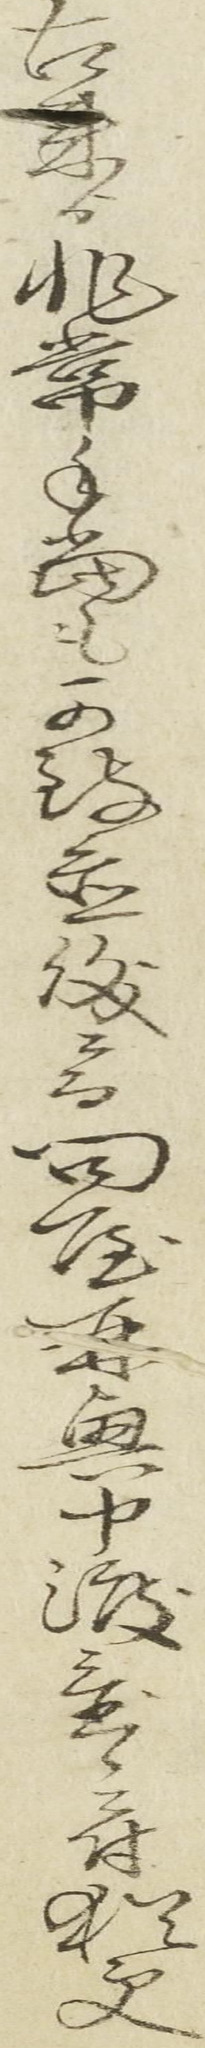古来ゟ非常手当も可致置儀二而問屋再興申渡置候に付猶更
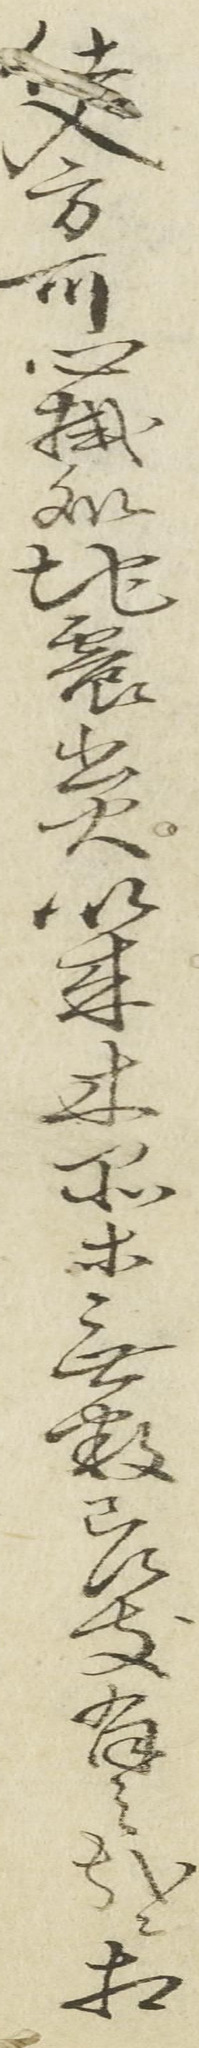仕入方可心掛処地震出火以来木品等無数差支有之哉二相
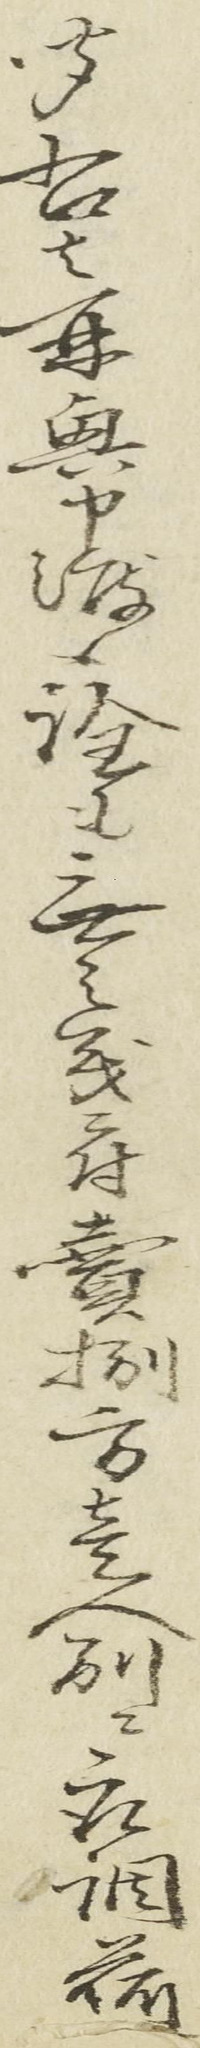聞右は再興申渡候詮も無之義二付売捌方壱人別二取調荷
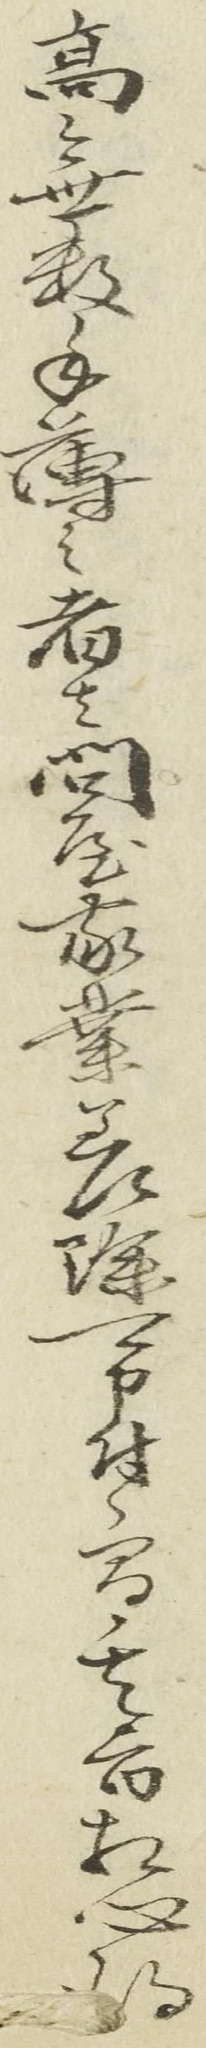高無数手薄之者は問屋家業差除可申付候間其旨相心得
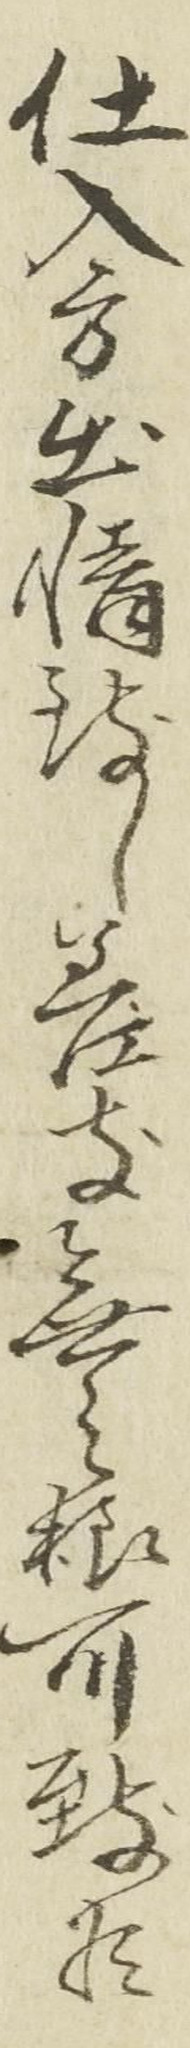仕入方出情致し差支無之様可致候
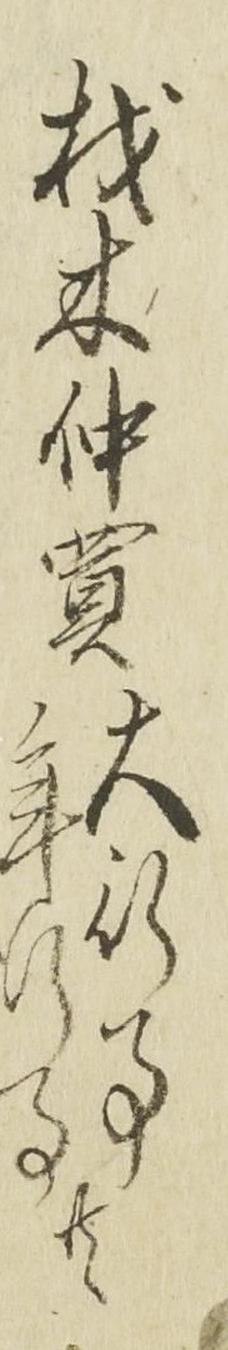材木仲買大行事共
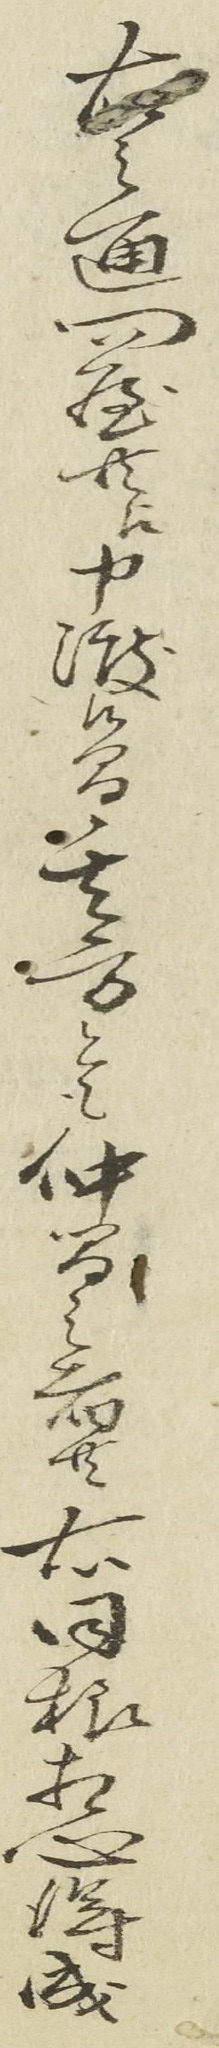右之通問屋共え申渡候間其方とも仲間之者共右同様相心得成
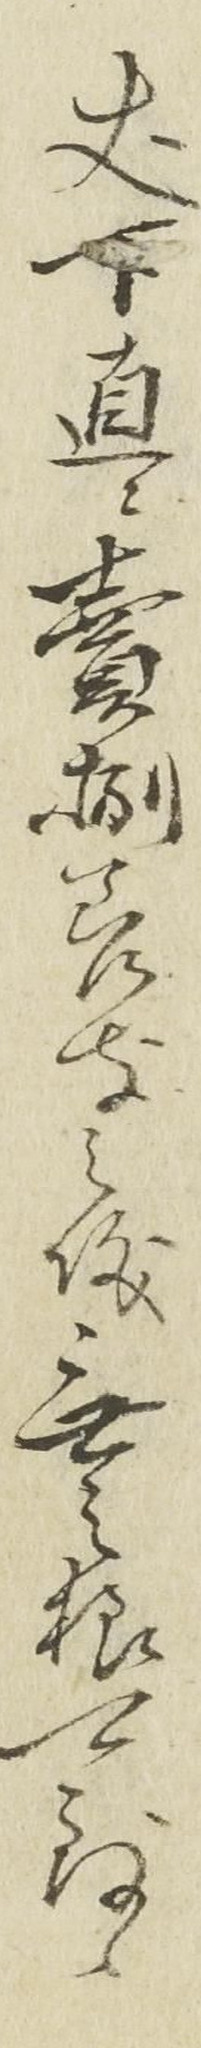丈下直二売捌差支之儀無之様可致候
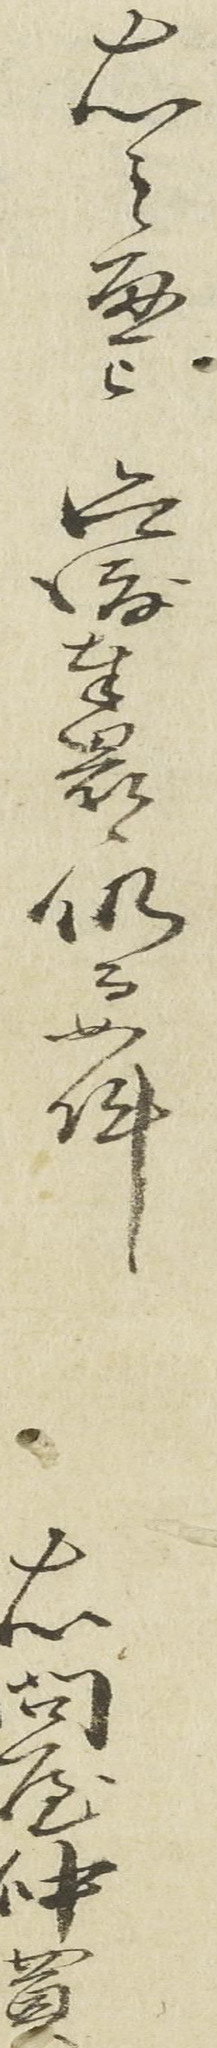右之通被仰渡奉畏候仍而如件右問屋仲買
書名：安政二乙卯年十月二日大地震之事
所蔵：東京大学地震研究所図書室 Earthquake Research Institute Library, The University of Tokyo, JAPAN
